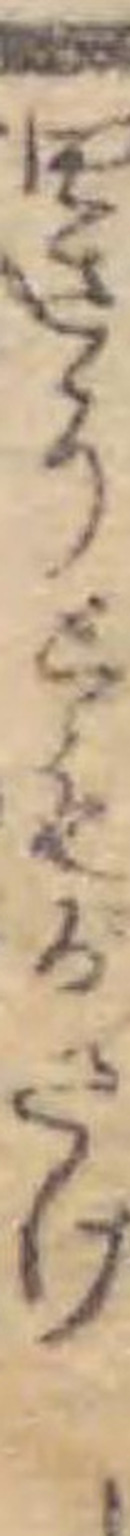四ざうともがさげ
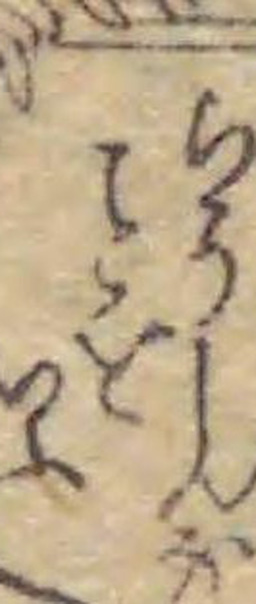ことを
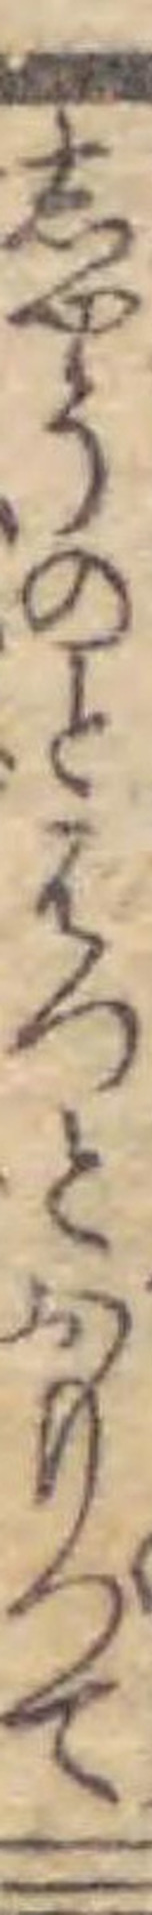しやうのとはつとおもつて
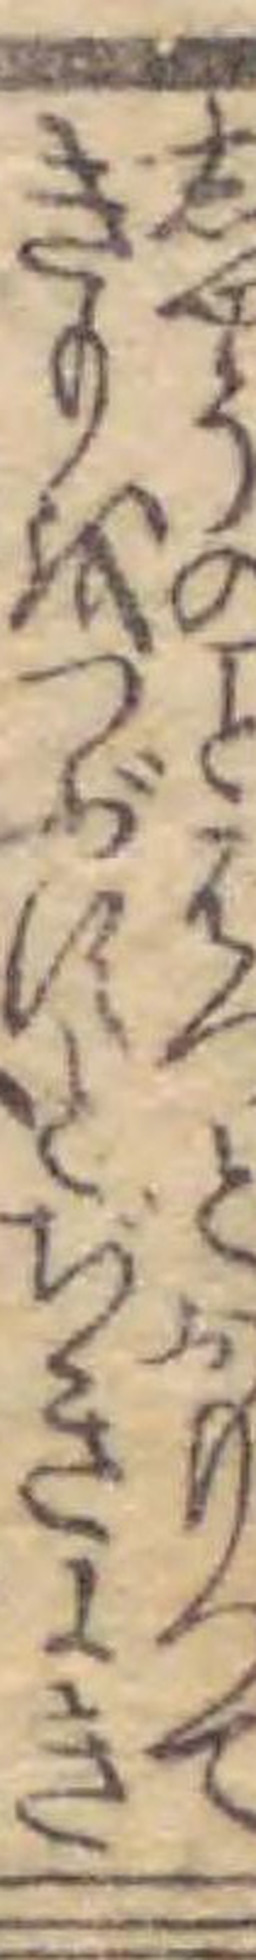きもをつぶすとぢきにき
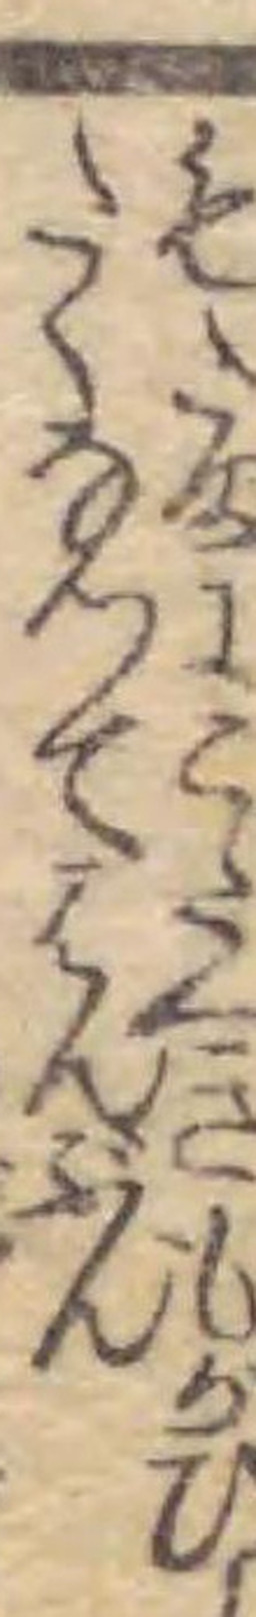たくなつてはんぶん
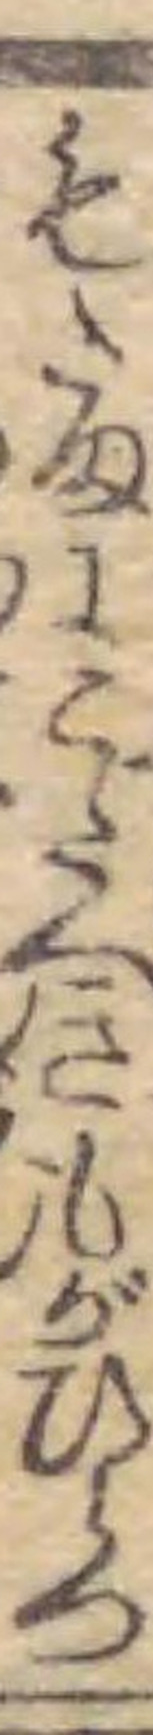もたまにこたへきもがひゝつ
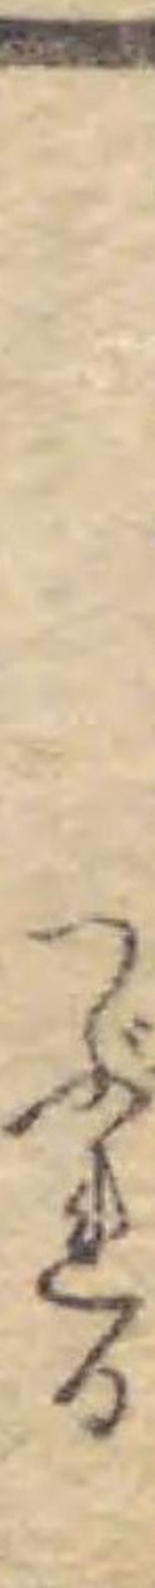つぶれる
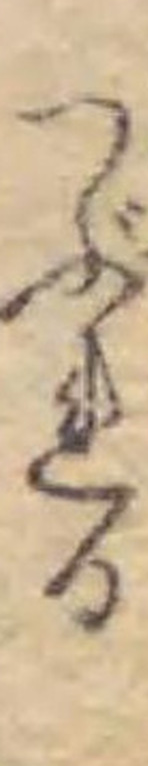つぶれる
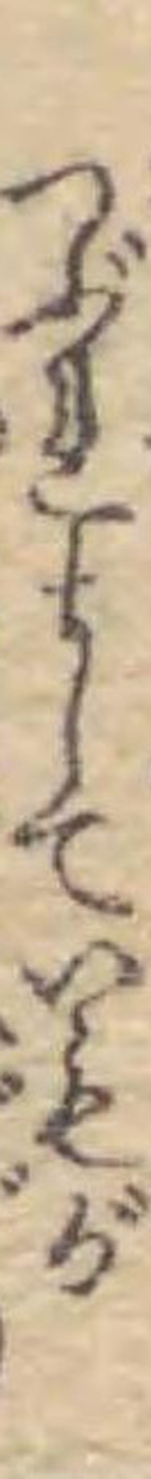つぶれましていもが
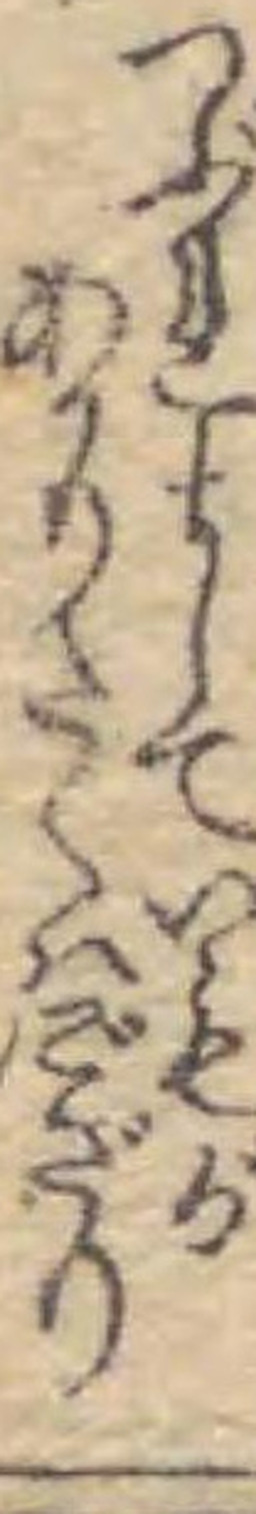あかりたくはござり
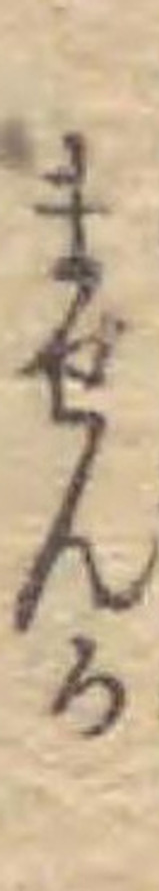ませんか
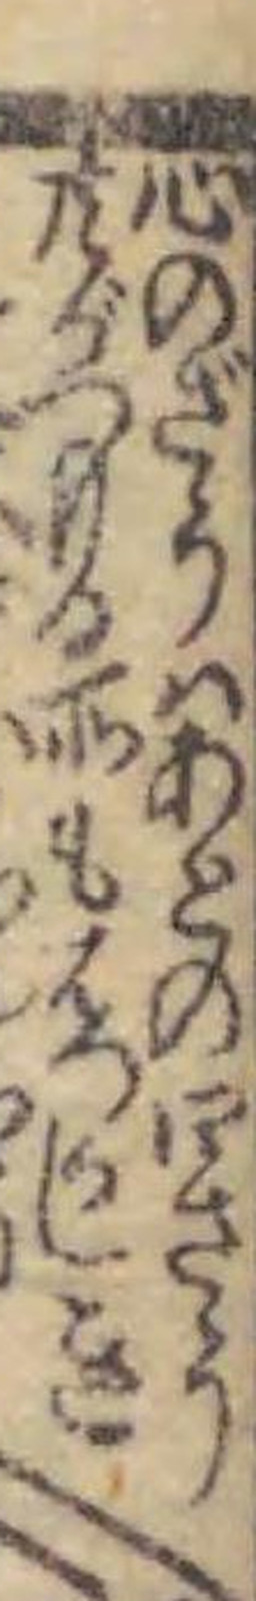共がつもる所もはつかしき
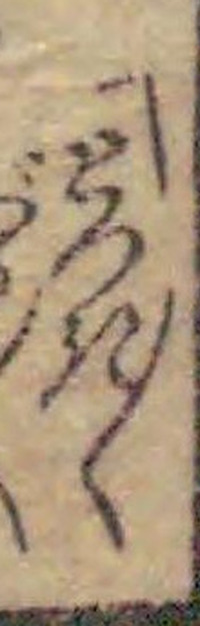〽とつき〳〵
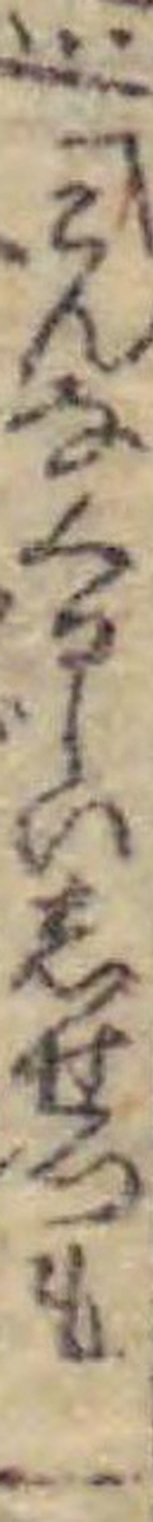〽こんなくるしいしせつも
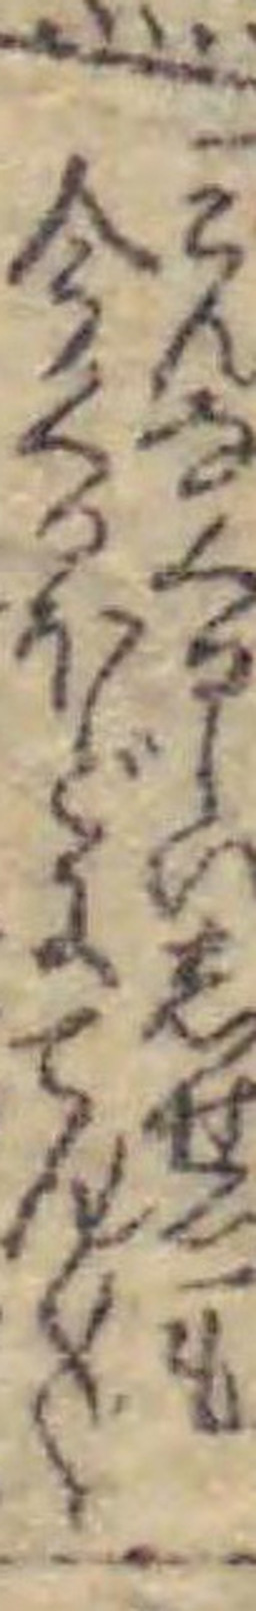今くるほどにてん〳〵〳〵
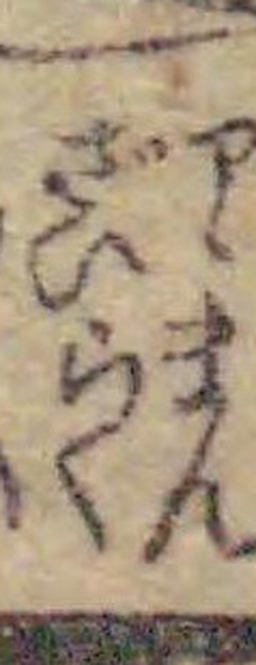ざいらく
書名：十四傾城腹之内 : 3巻
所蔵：国立国会図書館 National Diet Library, JAPAN
